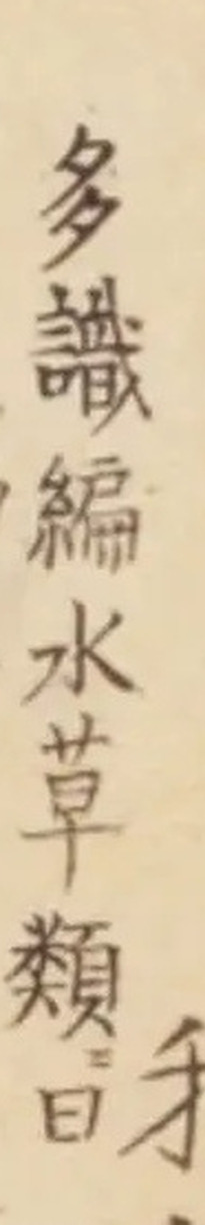多識編水草類ニ曰
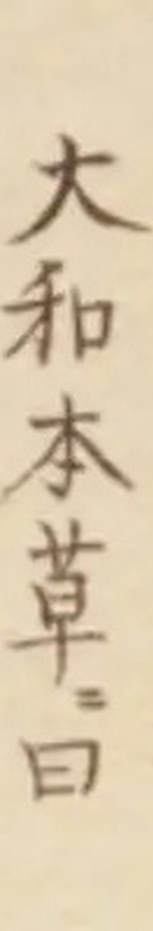大和本草ニ曰
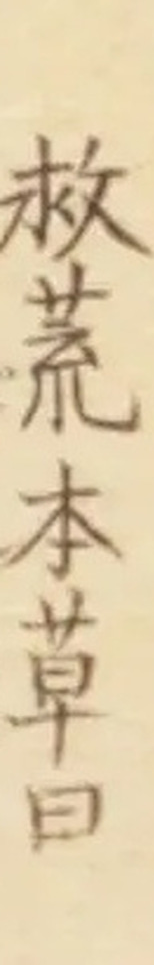救荒本草曰
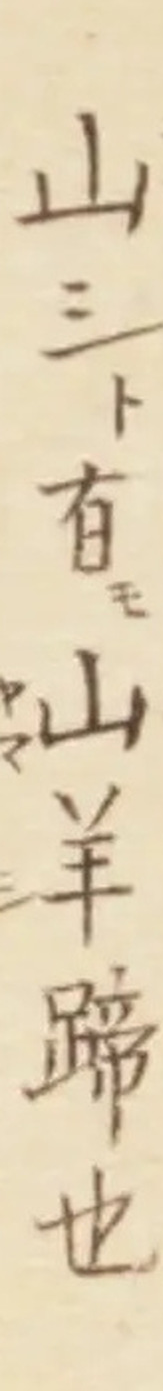山シト有モ山羊蹄也
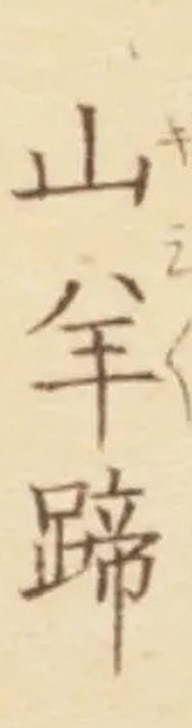山羊蹄
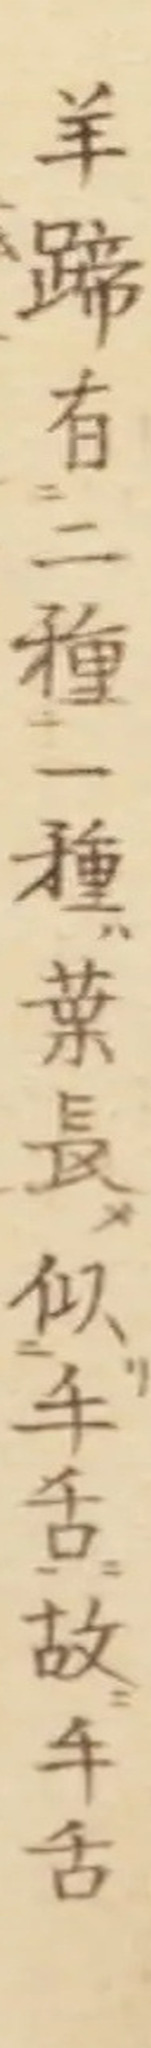羊蹄有二種一種ハ葉ハ長シテ似リ牛舌ニ故ニ牛舌
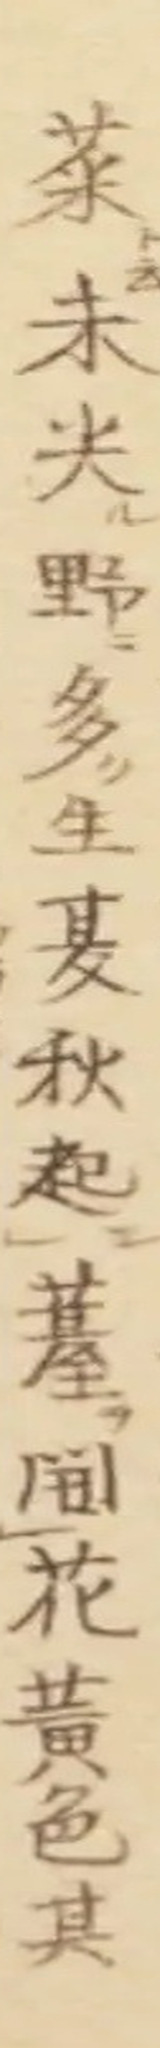菜ト云未尖ル野ニ多ク生夏秋起シ䑓ヲ開花黄色其
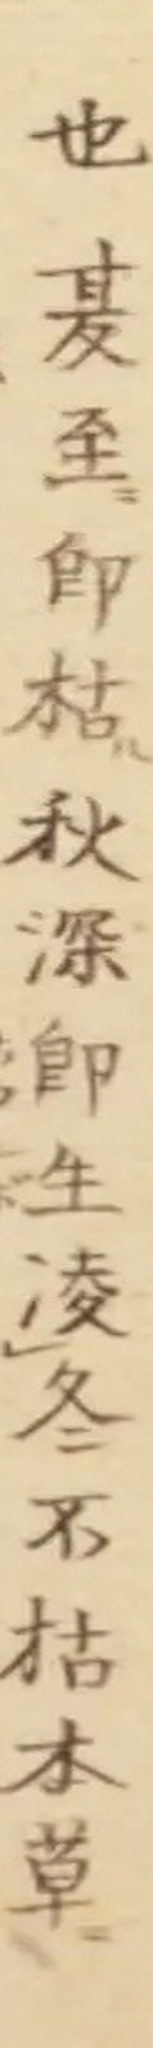也夏至ニ即枯ル秋深即生凌冬不枯本草ニ
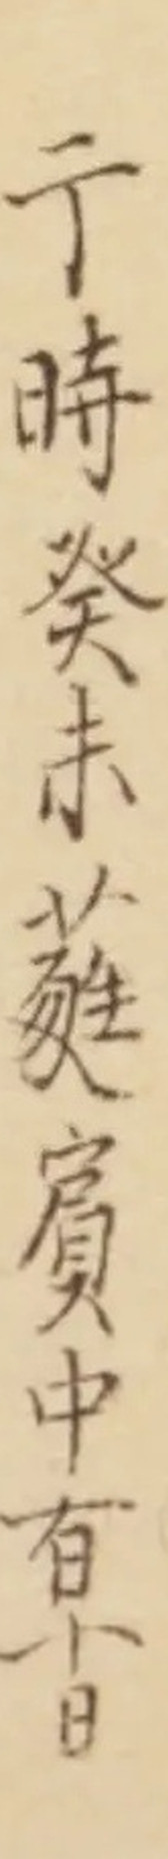亍時癸未蕤賓中有十日

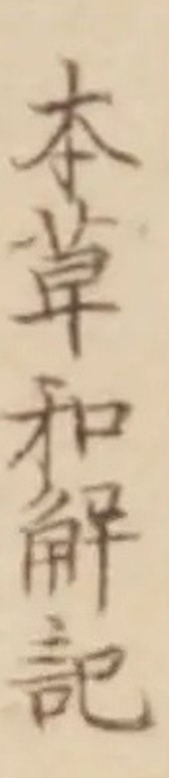本草和解記
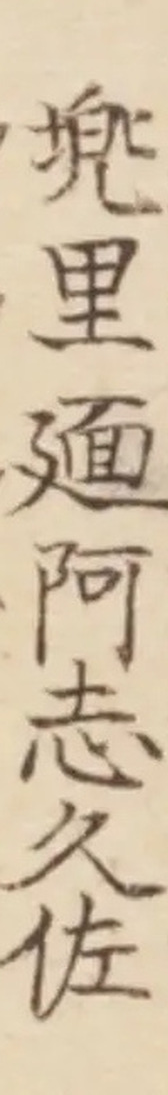兜里阿志久佐
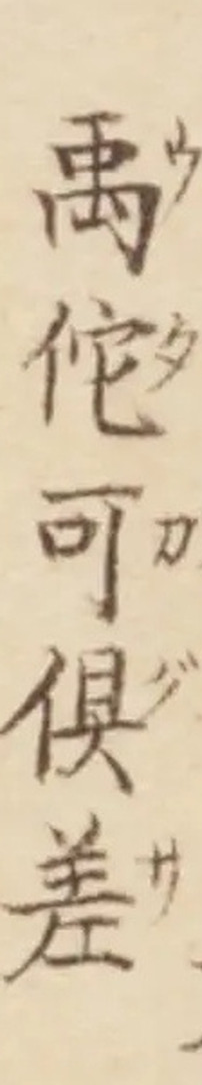禹陀加俱差
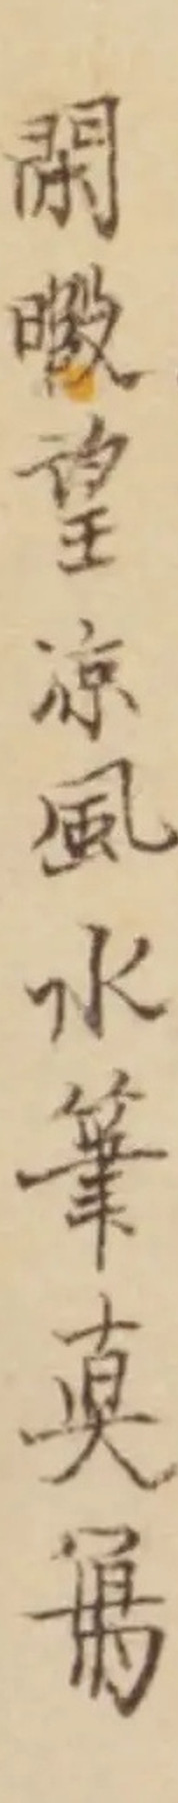閑暇望涼風水筆真寫
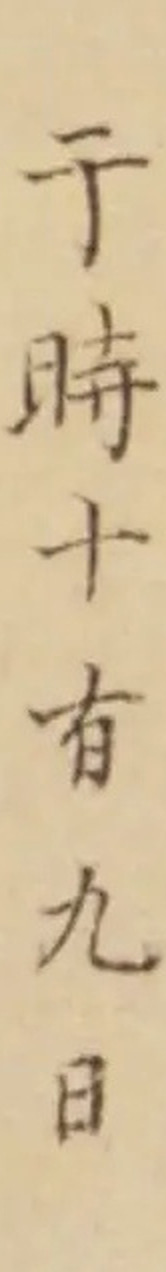亍時十有九日

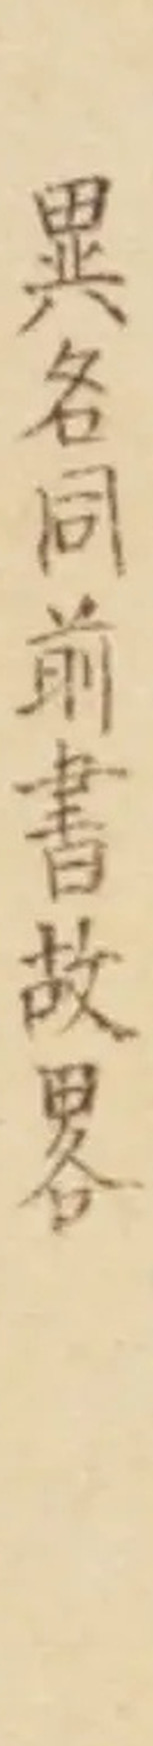異名同前書故畧
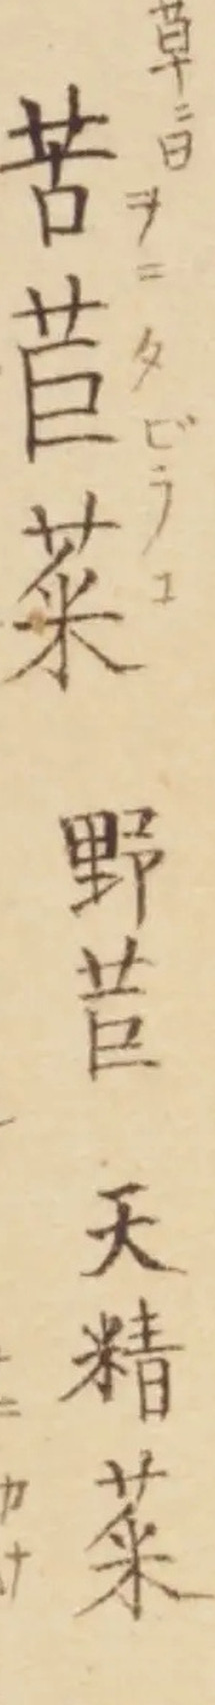苦苣菜野苣天精菜
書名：梅園草木花譜夏之部. 2
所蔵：国立国会図書館 National Diet Library, JAPAN
